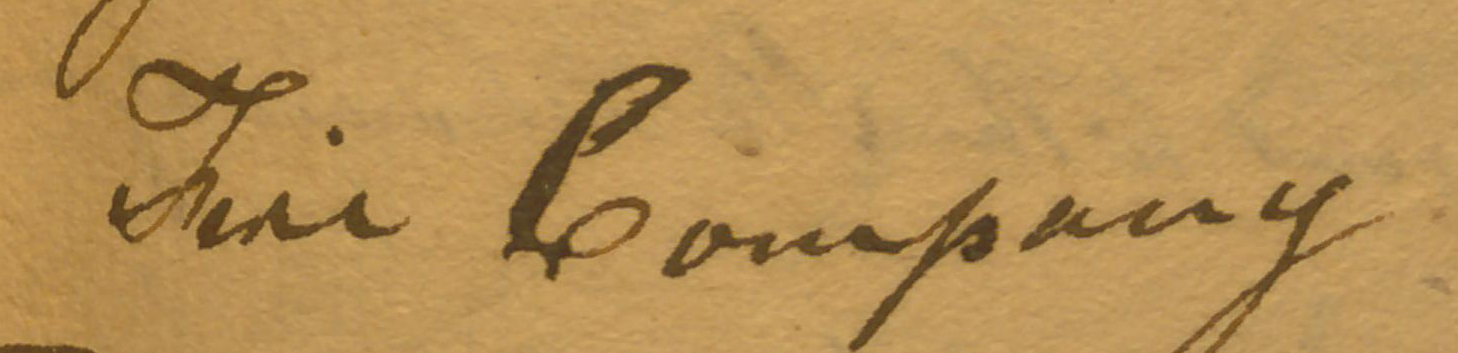Fire Company
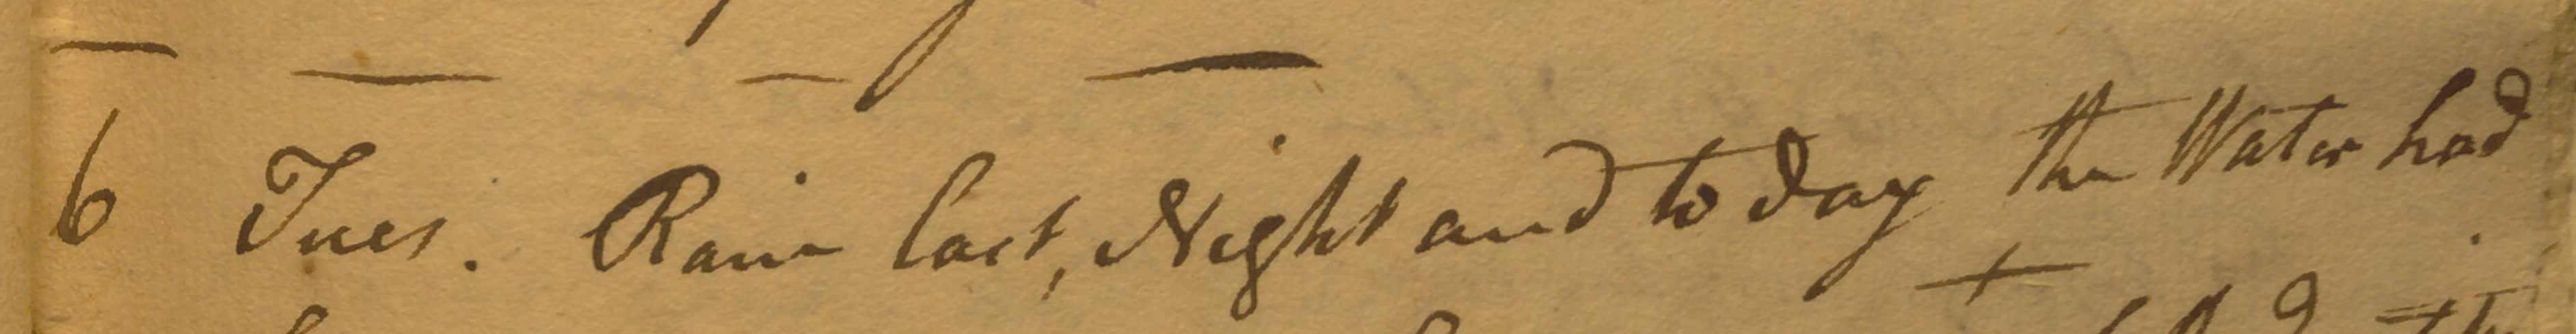6 Tues. Rain last Night and to day the Water had
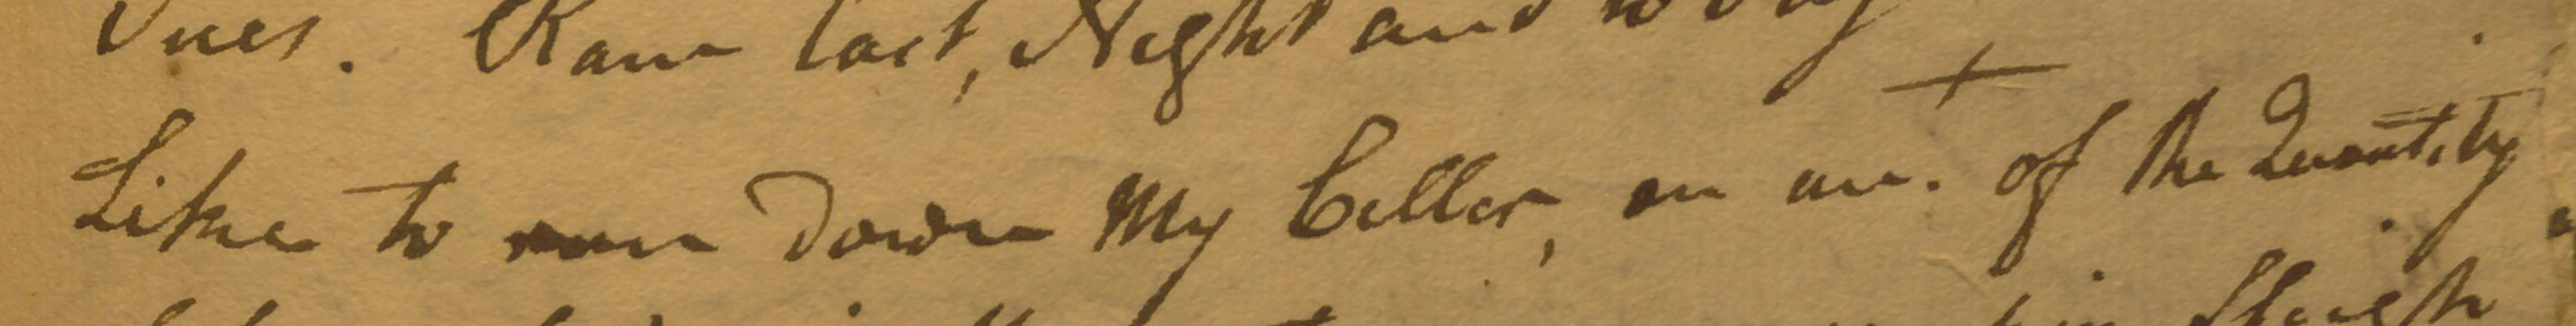Like to run down My Celler, an acc^t. of the Quantity
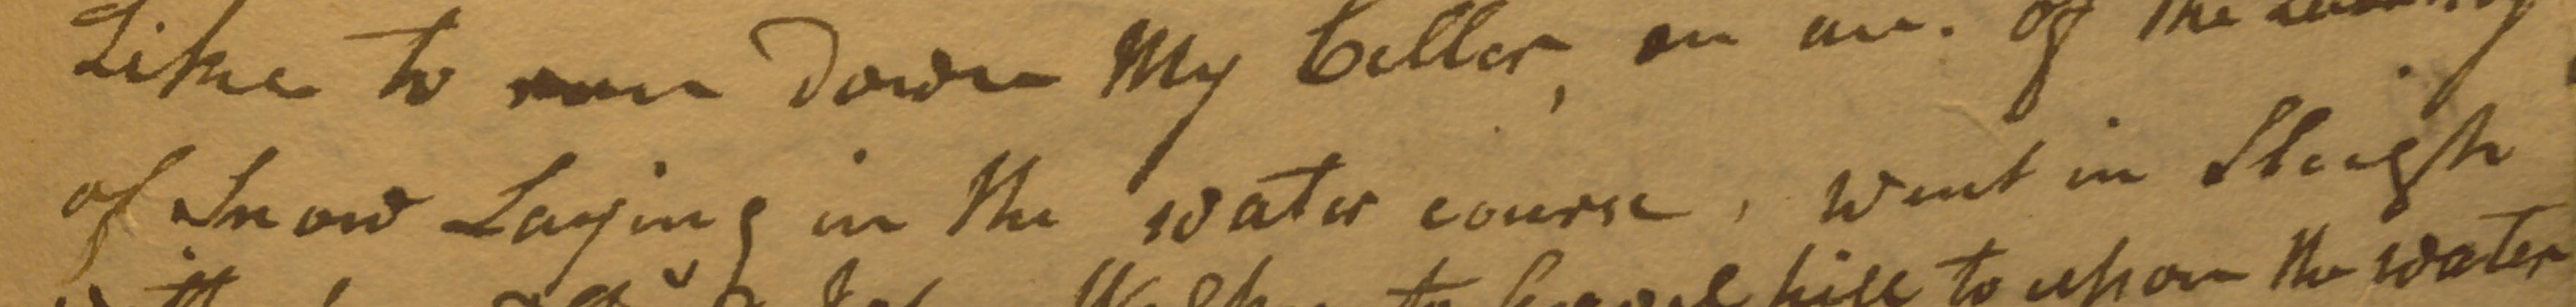of snow Laying in the water course, went in Sleigh
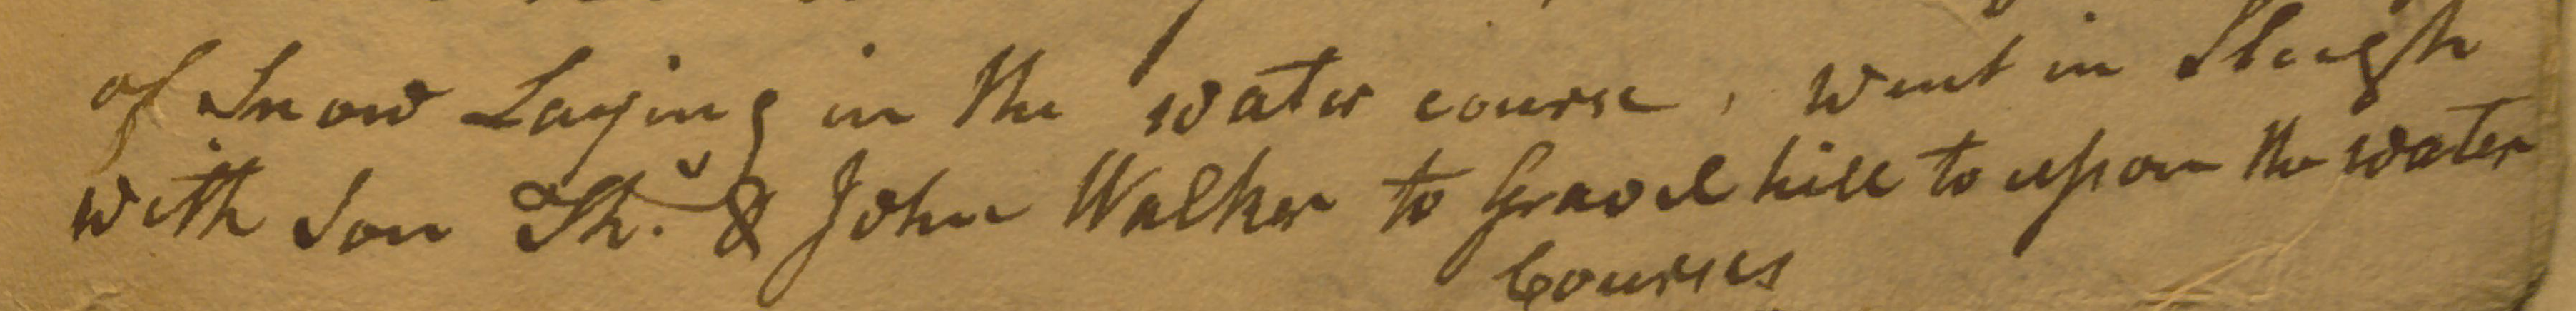with Son Th^s. & John Walker to Gravel hill to upon the water
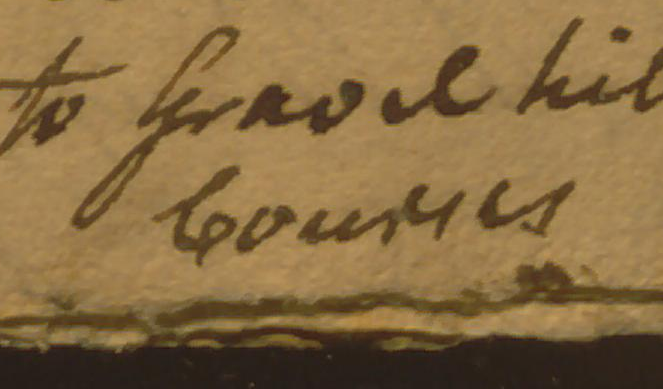Courses
